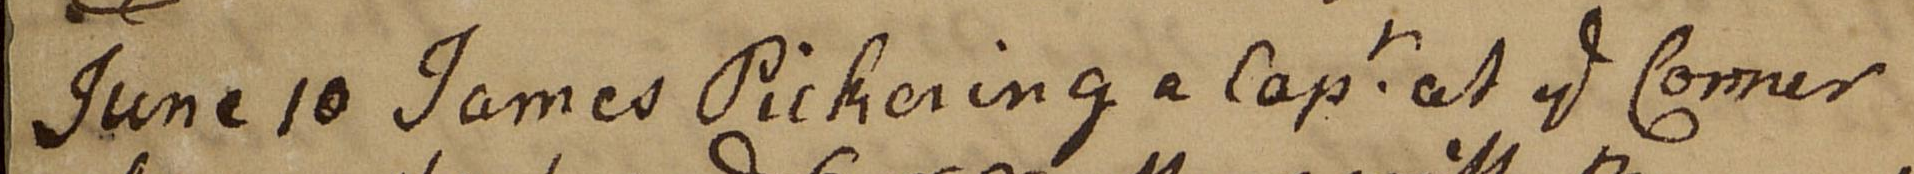June 10 James Pickering a Cap^t at y^e Corner
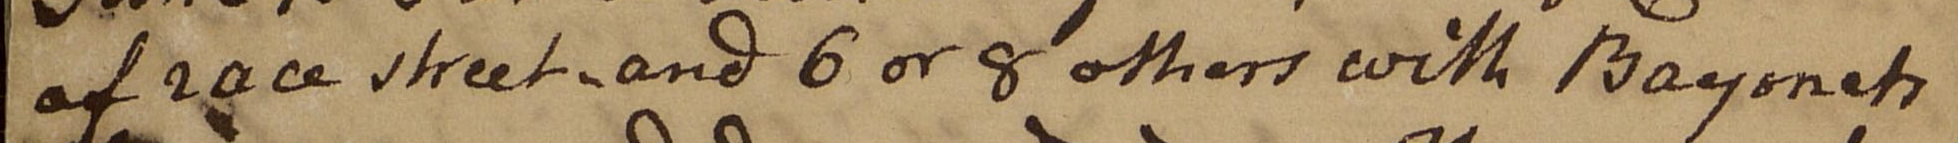at race street- and 6 or 8 others with Bayonets
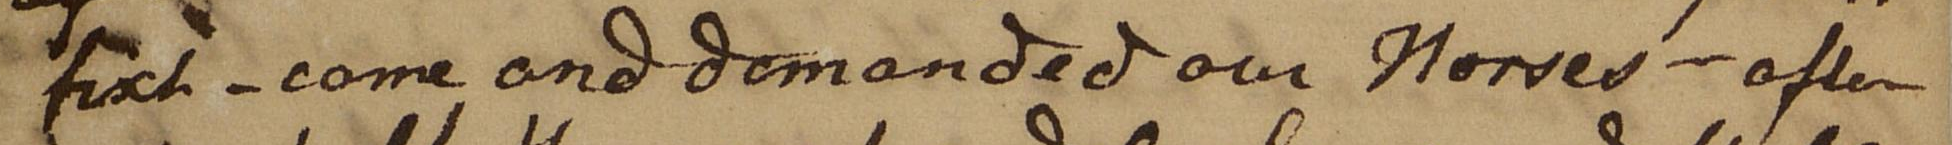fixt- come and demanded our Horses- after-
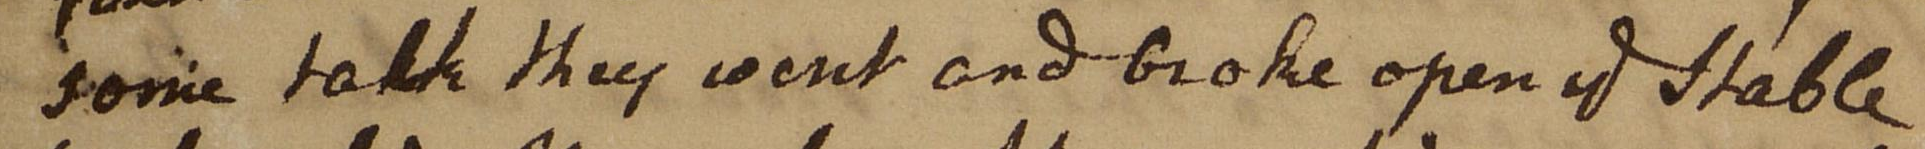some talk they went and broke open y^e Stable
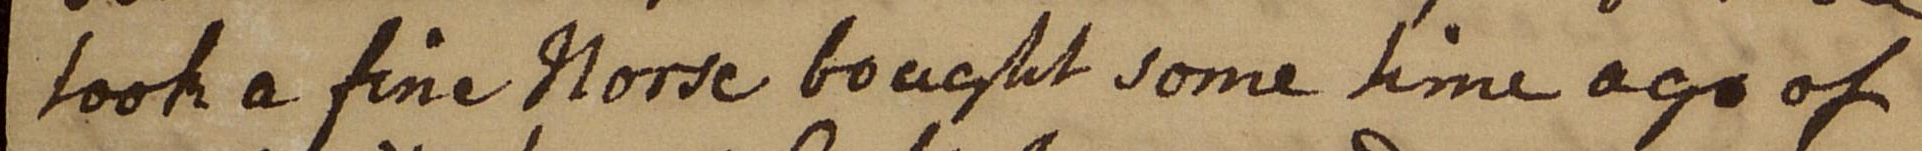took a fine Horse bought some time ago of
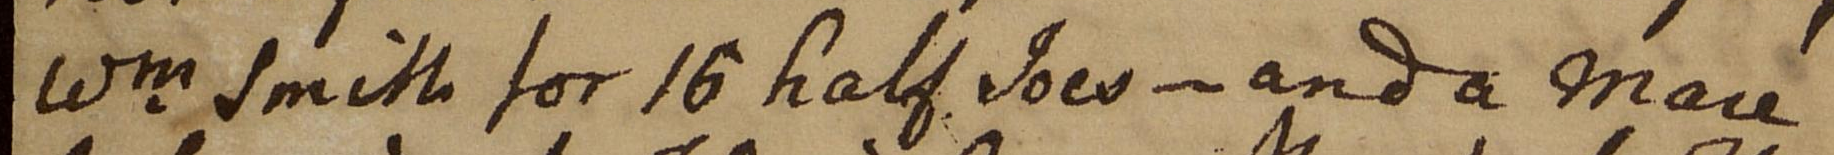W^m. Smith for 16 half Joes- and a Mare
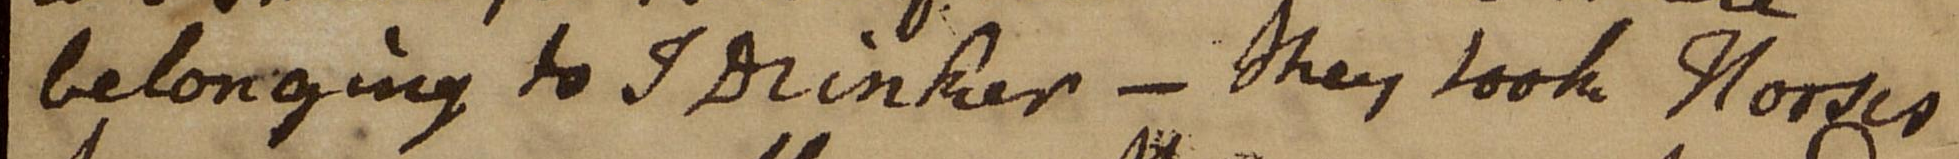belonging to I Drinker- they took Horses
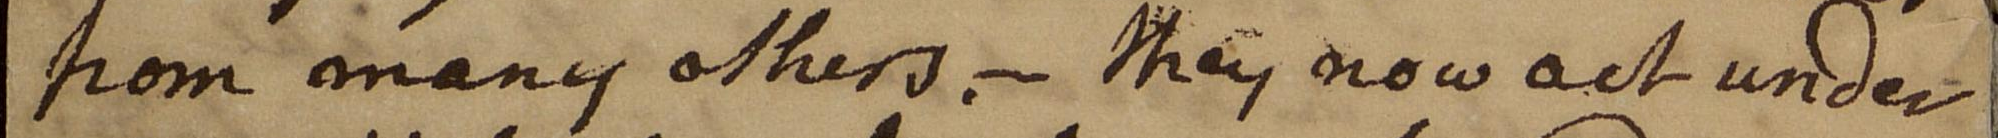from many others,- they now act under
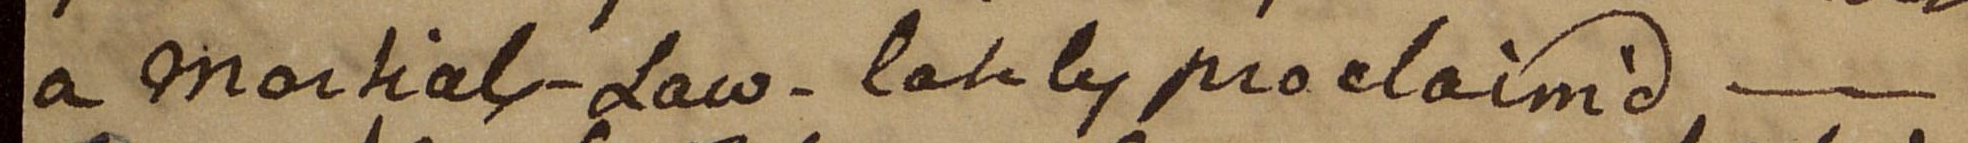a Martial-Law- lately proclaim'd-
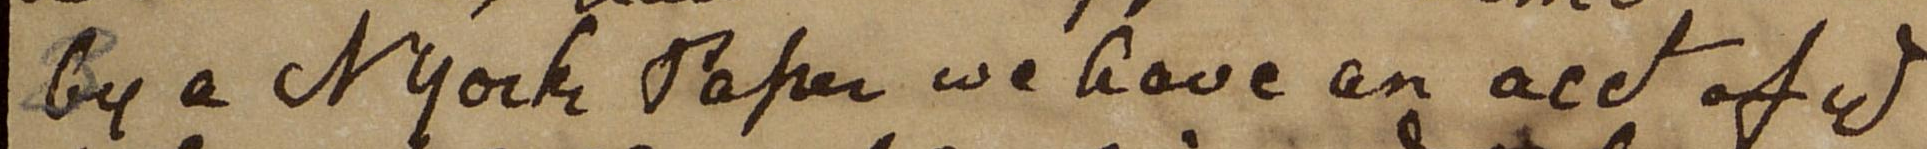by a N York Paper we have an acc^t of y^e
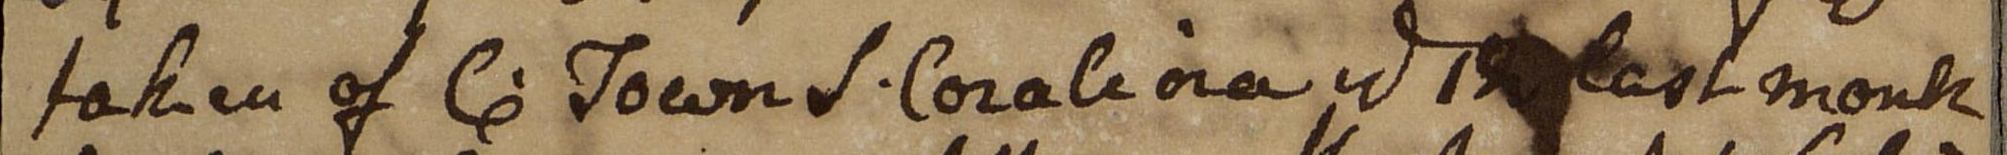taken of C. Town S. Coralina y^e 12 last month
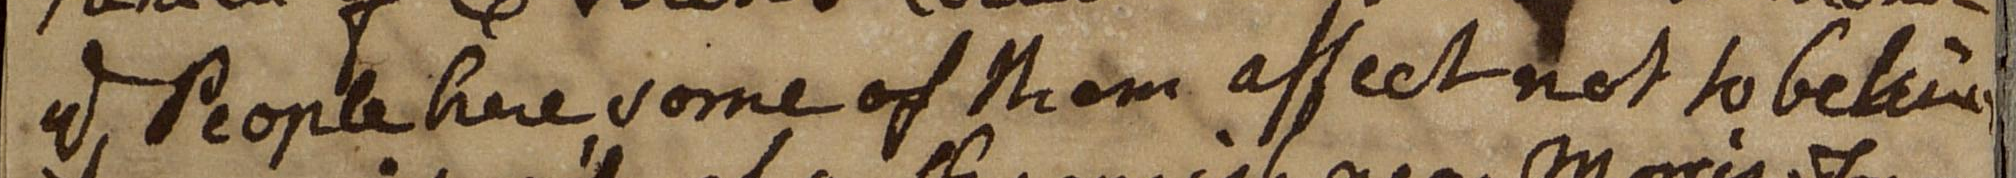y^e People here some of them affect not to believe
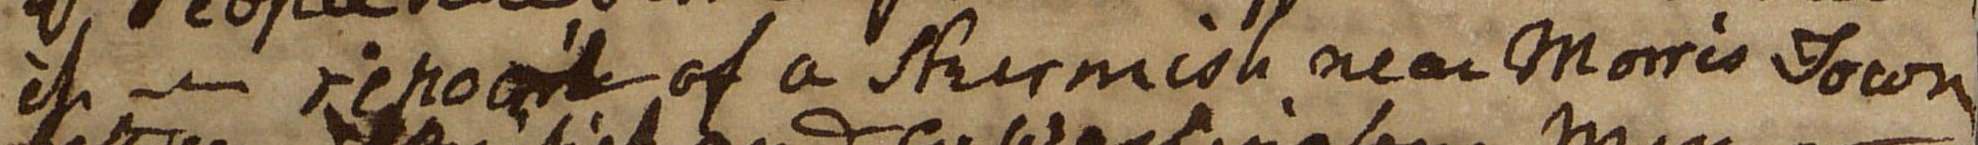it- repoart of a Skirmish near Morris Town
